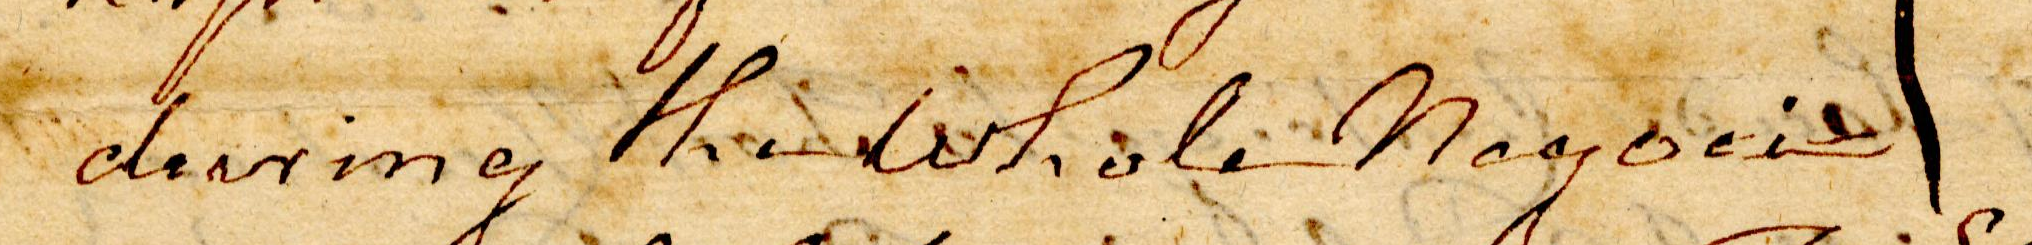during the whole Negoci
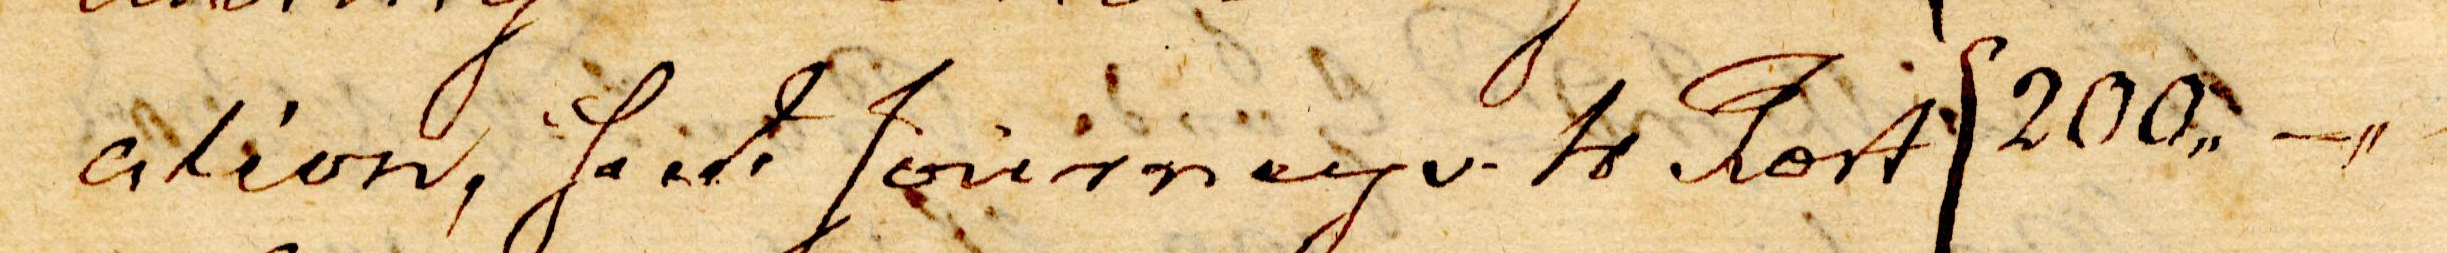ation, said Journeys to Fort 200..-
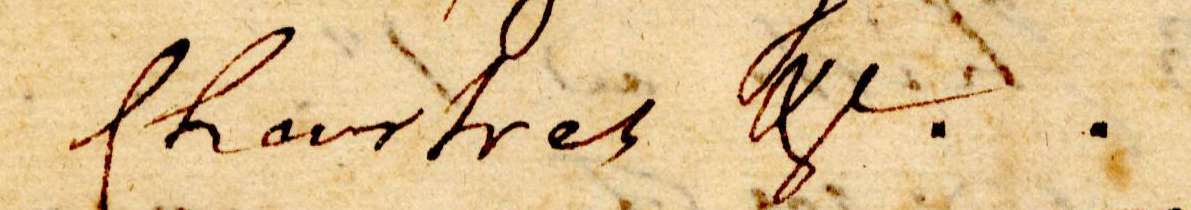Chartres &c.
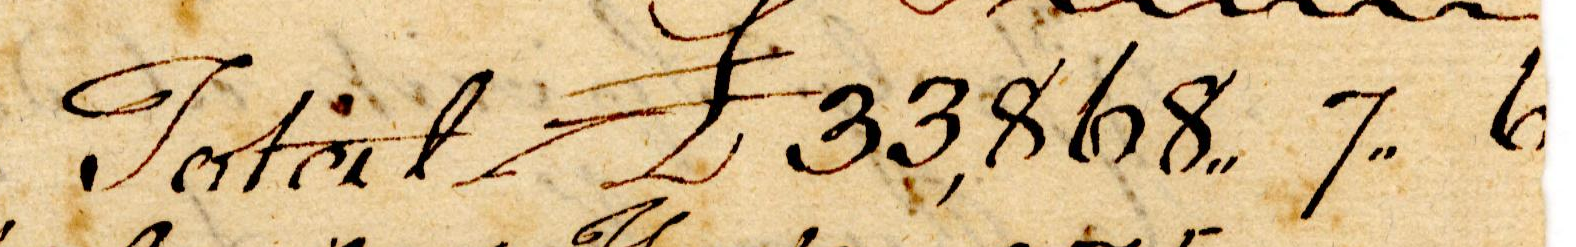Total £33,868.7.6
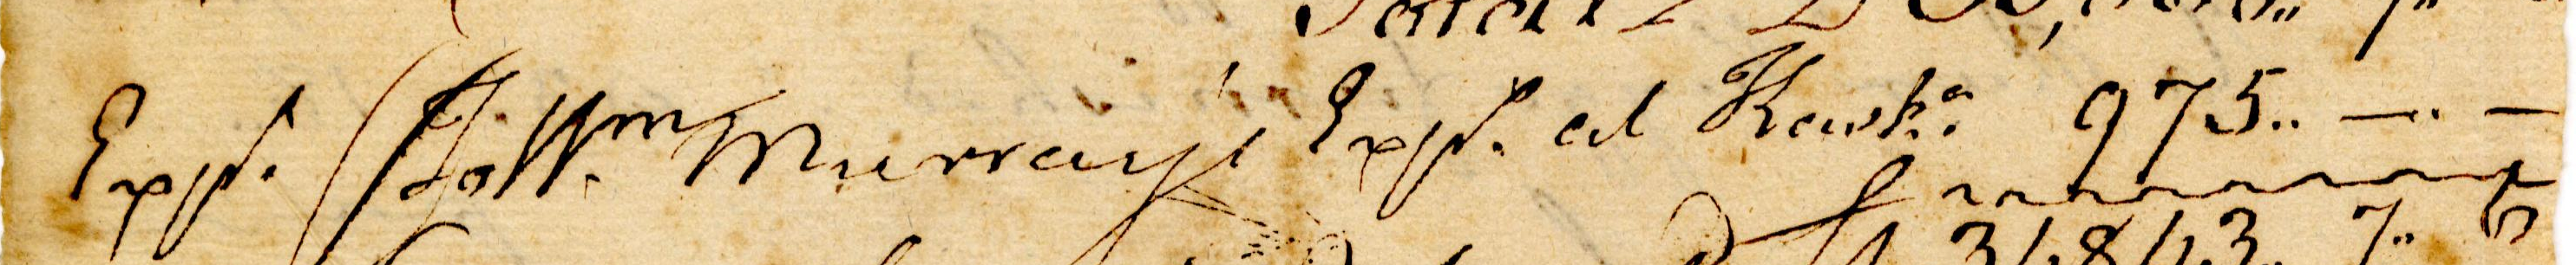Esq^r to W^m Murray Exp^s. at Kewk^a. 975..-.-
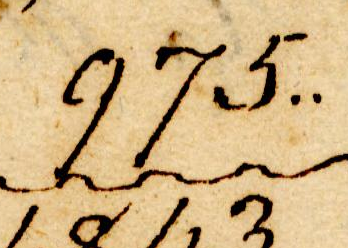275
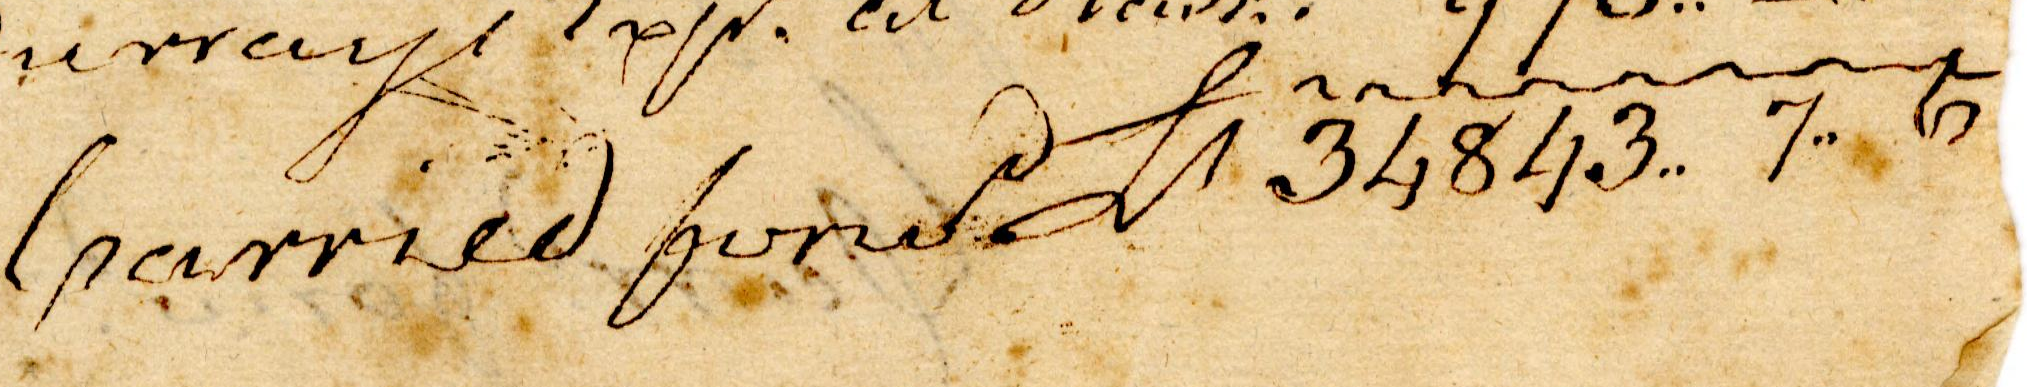carried forw^d. £ 34843..7..6
